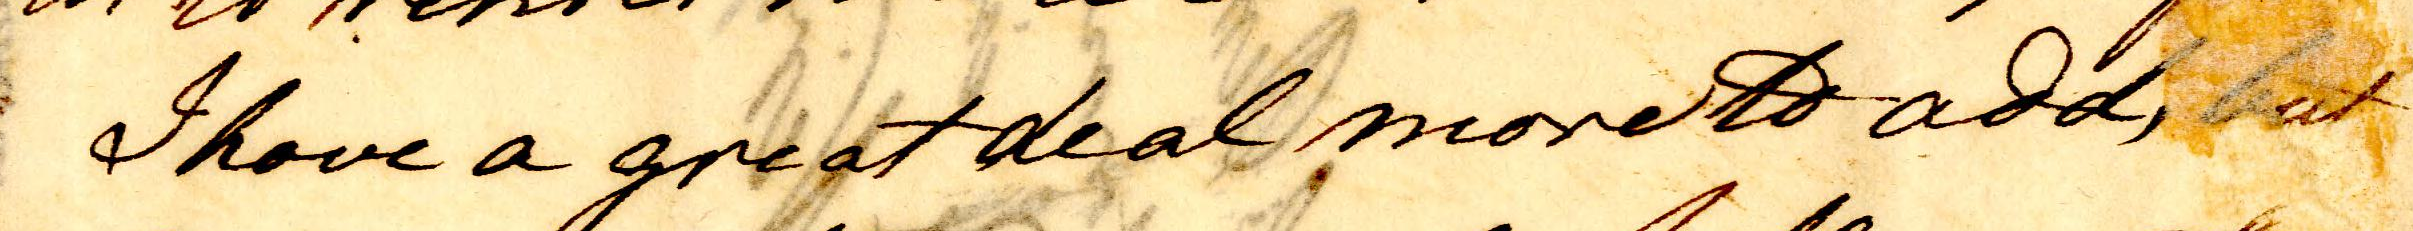I have a great deal more to add, but
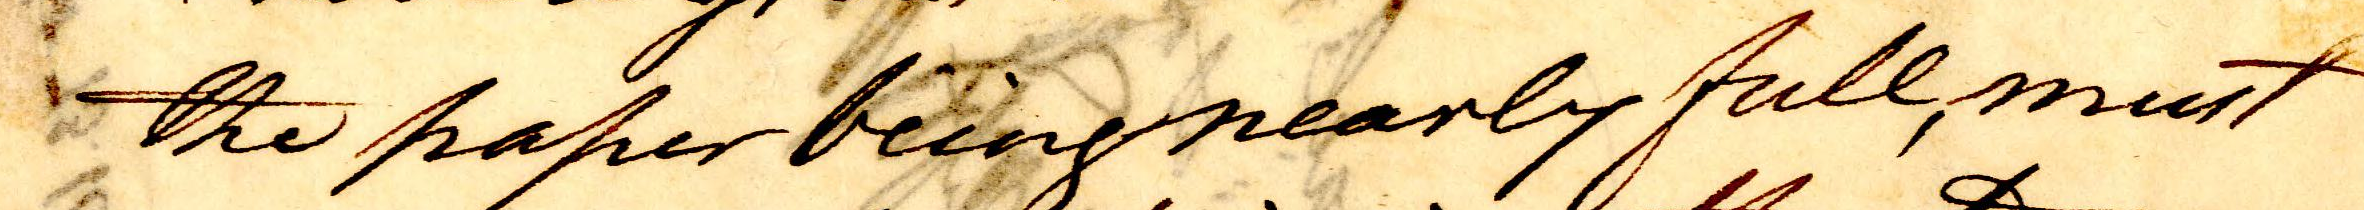the paper being nearly fully, must
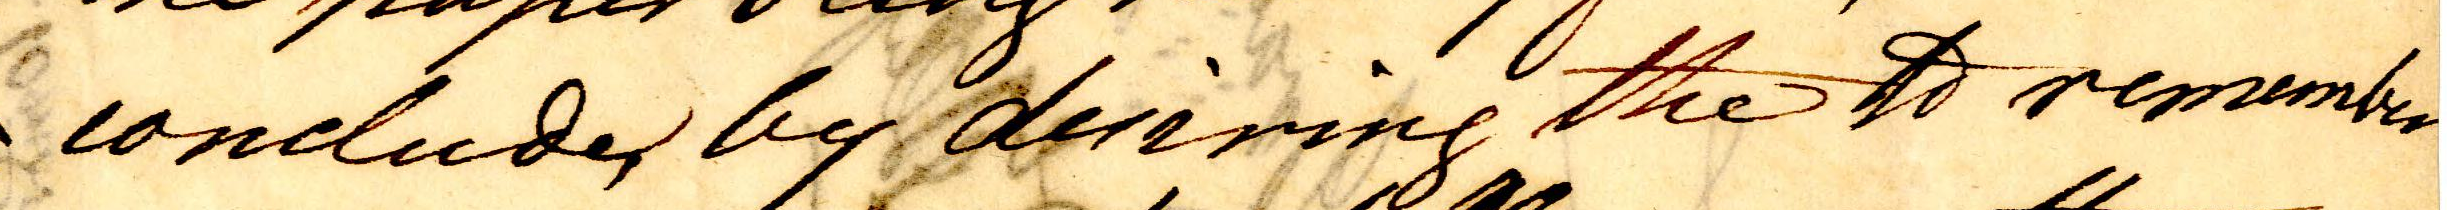conclude, by desiring the to remember
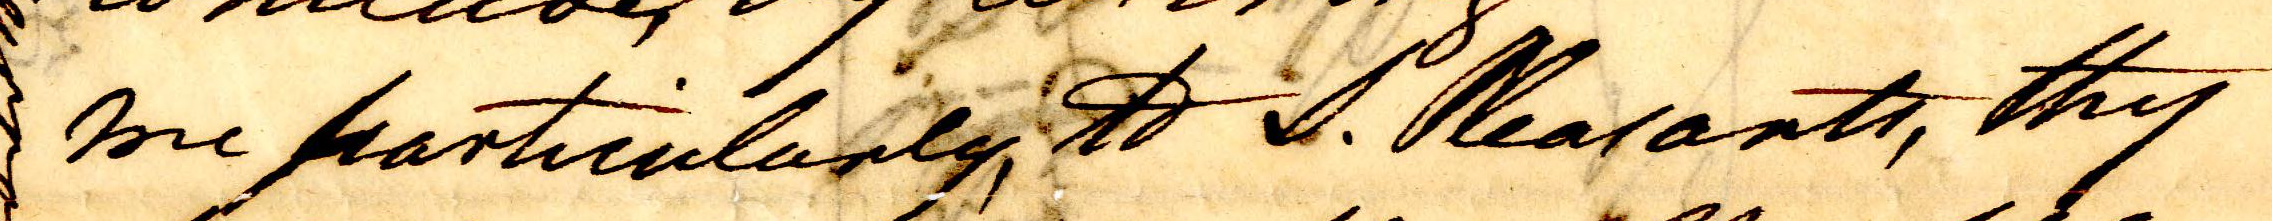me particularly, to S. Pleasants, thy
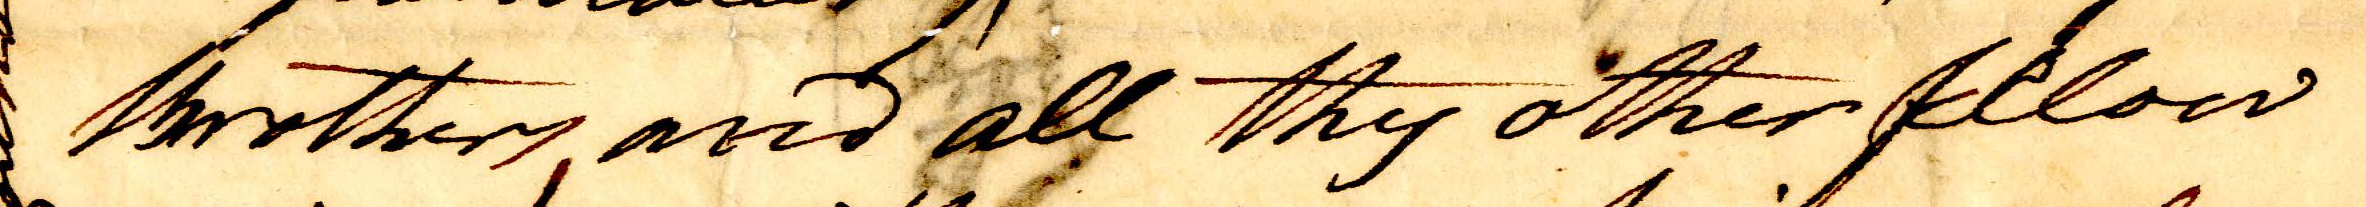Brothers, and all thy other fellow
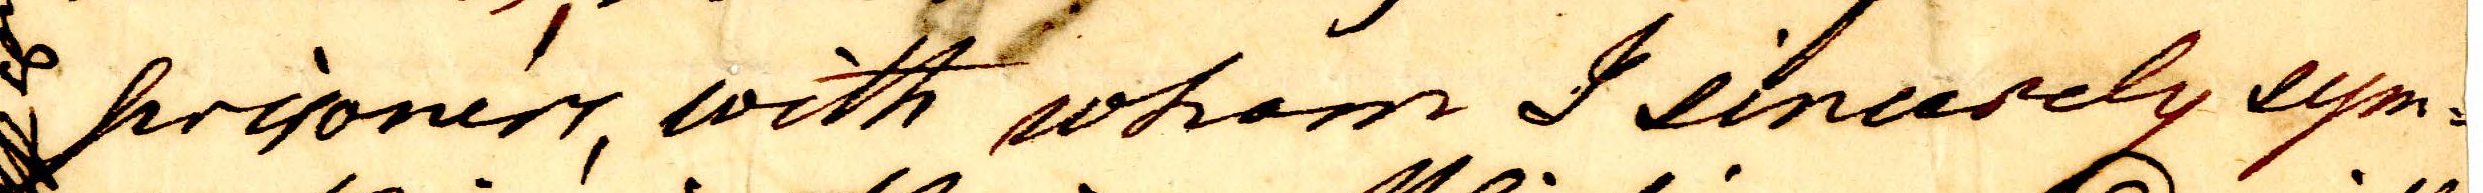prisoners, with whom I sincerely sym-
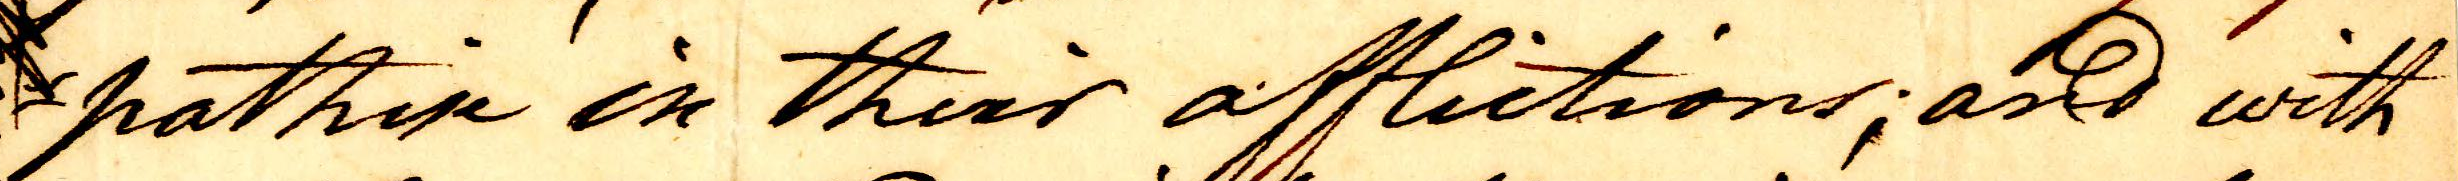pathise in their afflictions; and with
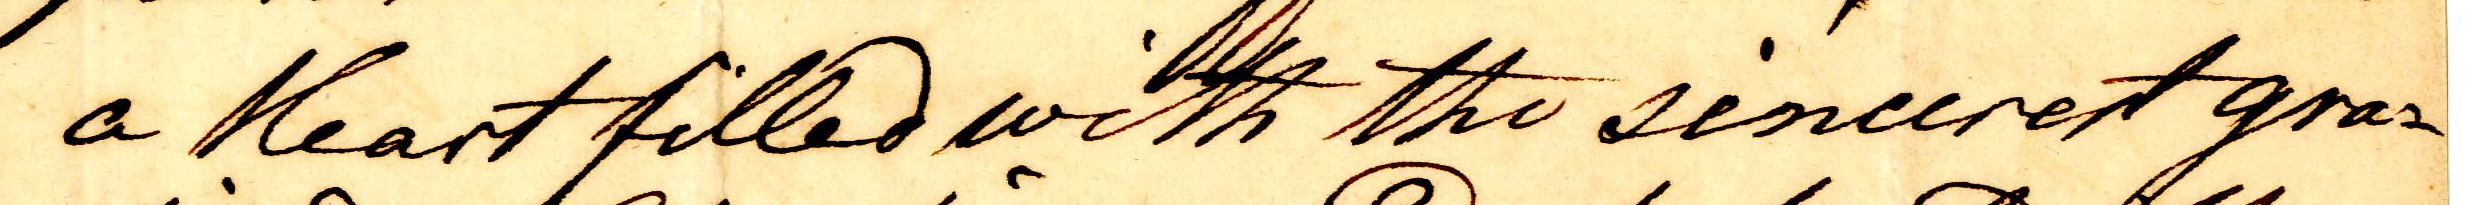a Heart filled with the sincerest gra-
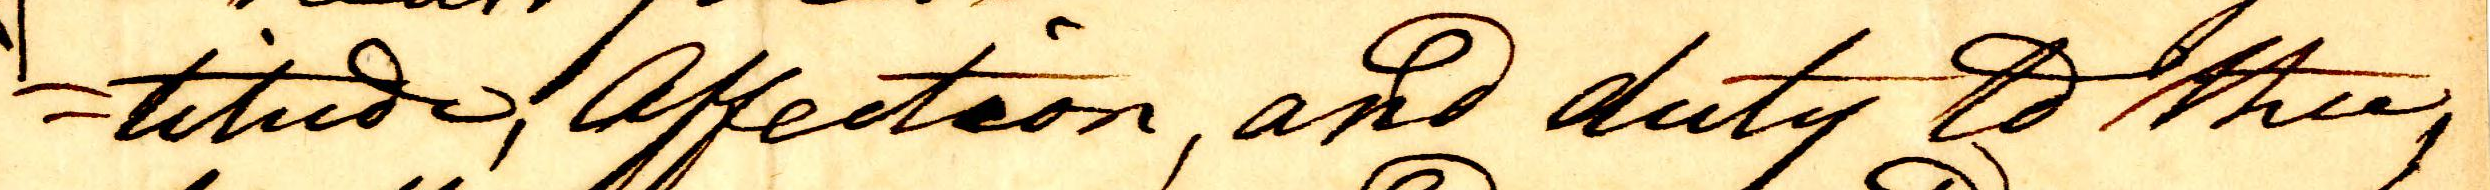-titude, Affection, and duty to thee,
